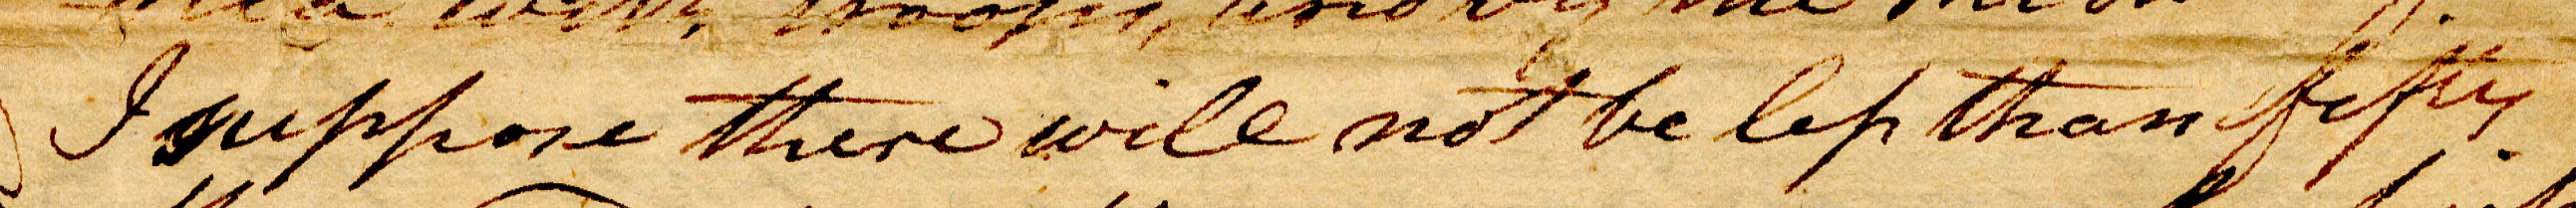I suppose there will not be less than fifty
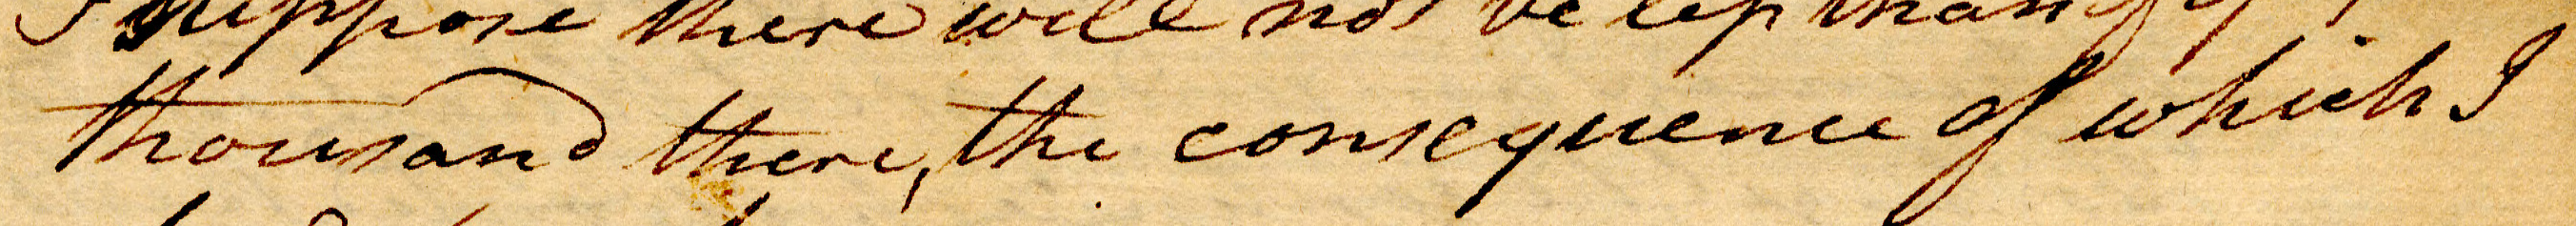thousand there, the consequence of which I
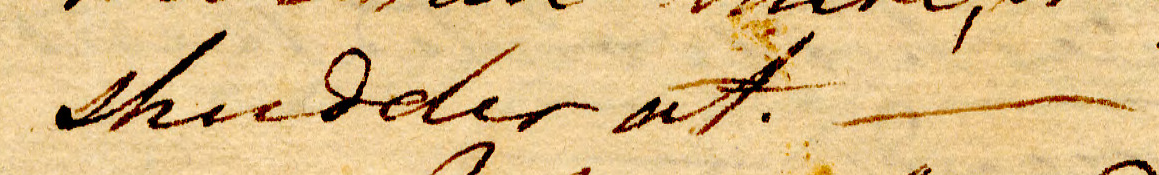shudder at.-
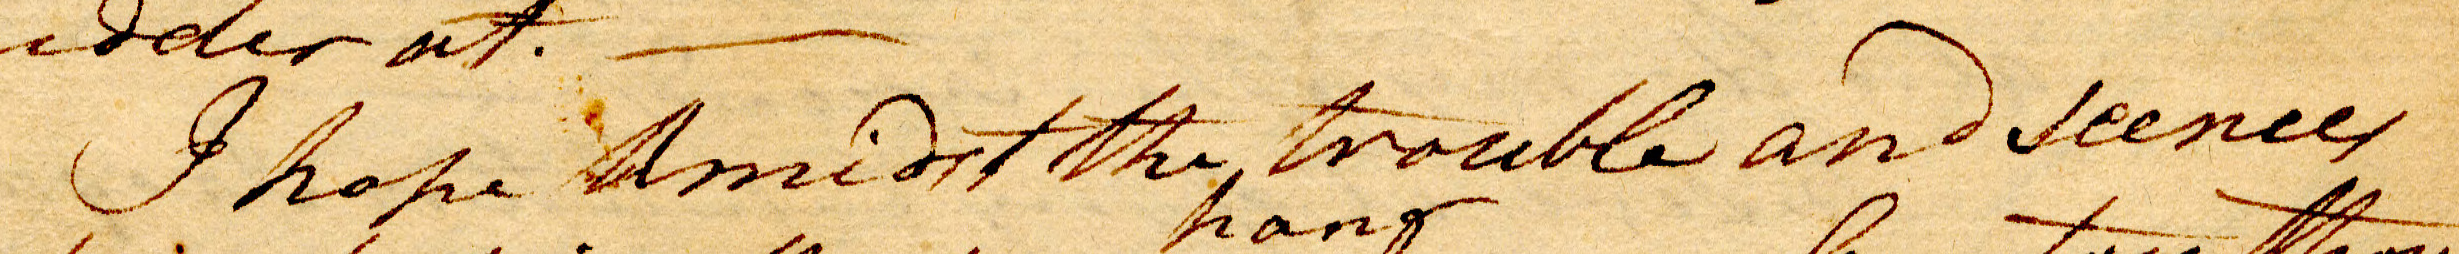I hope Amidst the trouble and scenes
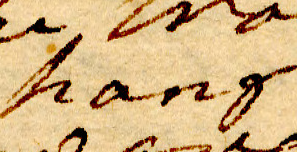hang
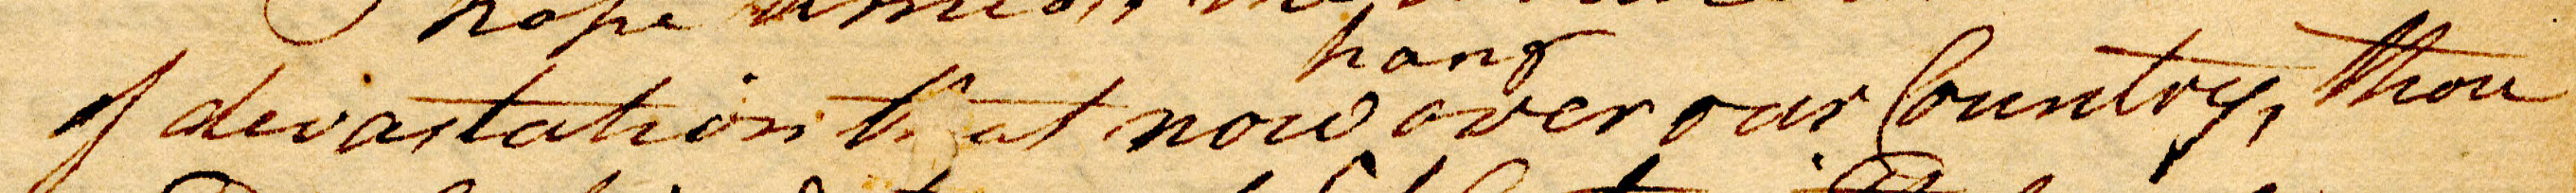of devastation that now ^ over our Country, thou
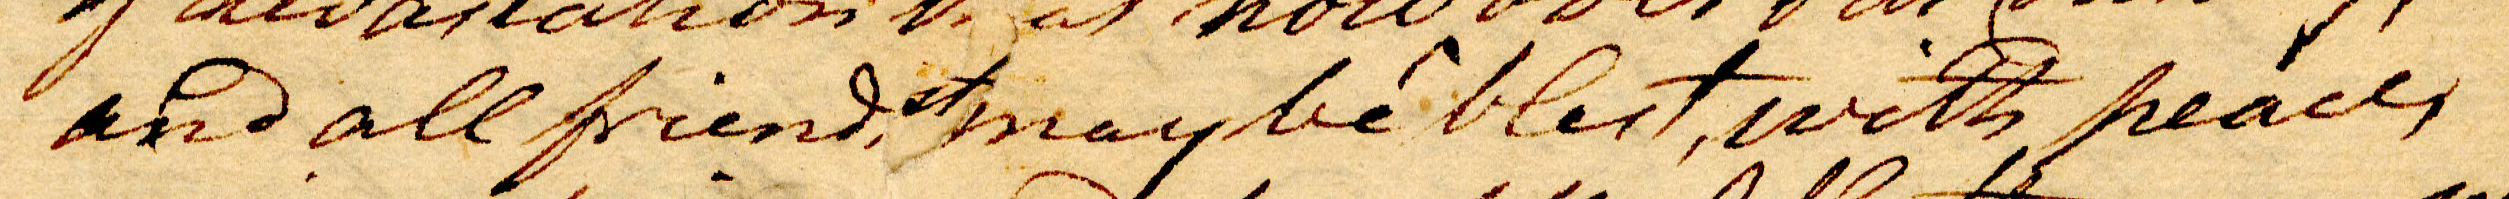and all friends may be blest with peace,
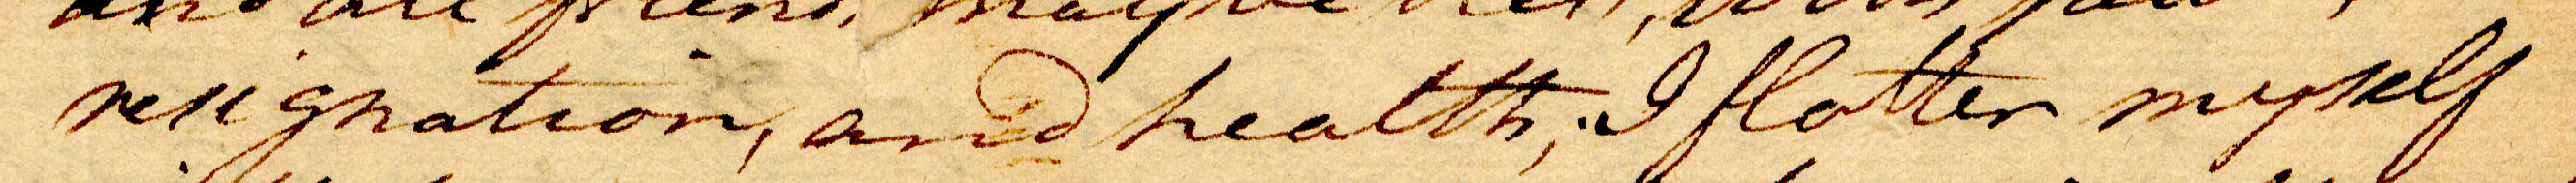resignation, and health, I flatter myself
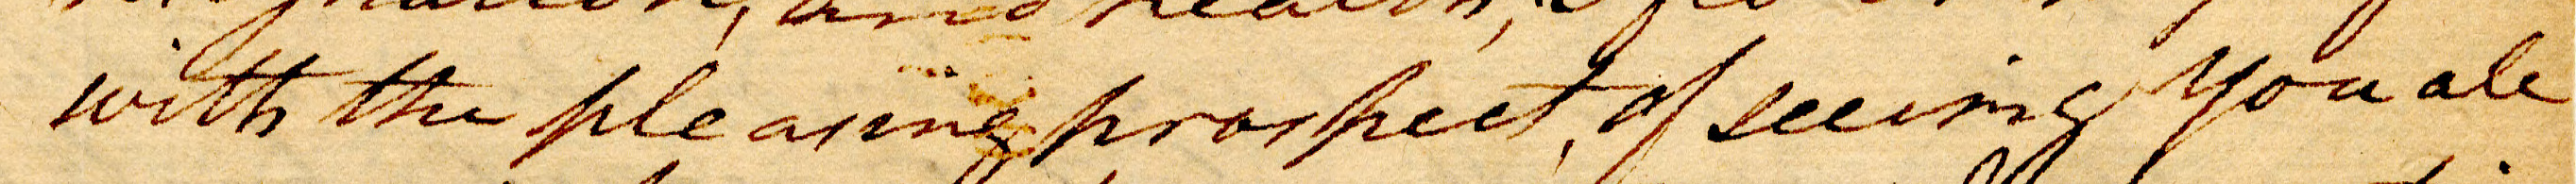with the pleasing prospect of seeing you all
